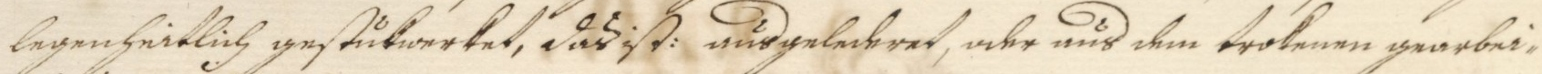legenheitlich gestukwerket, das ist: ausgelederet, oder aus dem trokenen gearbei-
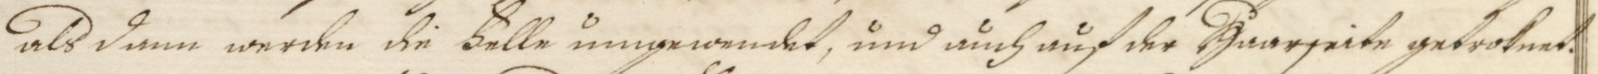als dann werden die Felle umgewendet, und auch auf der Haarseite getroknet.
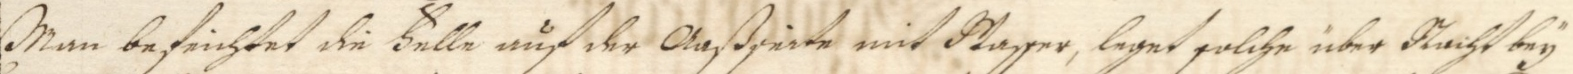Man befeichtet die Felle auf der Aaßseite mit Wasser, leget solche über Nacht bey
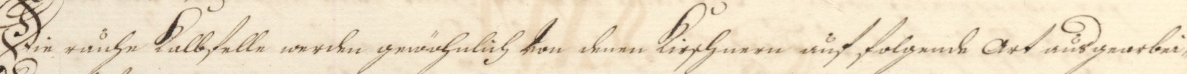Die rauhe Kalbfelle werden gewöhnlich von denen Kirschnern auf folgende Art ausgearbei-
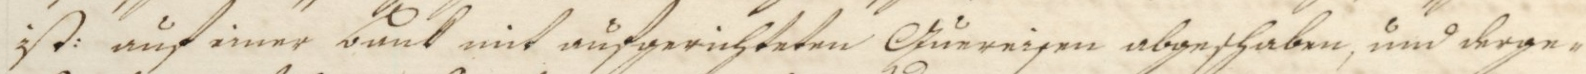ist: auf einer Bank mit aufgerichteten Zuereisen abgeschaben, und derge-
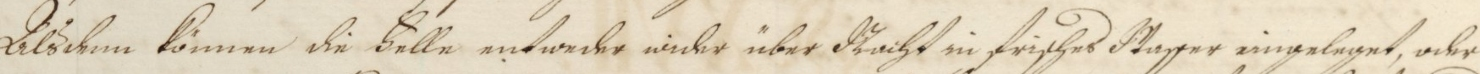Alsdenn können die Felle entweder wider über Nacht in frisches Wasser eingeleget, oder
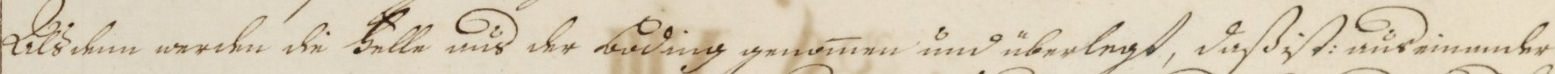Als denn werden die Felle aus der Boding genommen und überlegt, daß ist: auseinander
